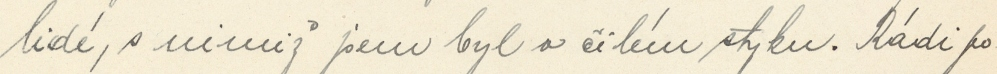lidé, s nimiž jsem byl v čilém styku. Rádi po-
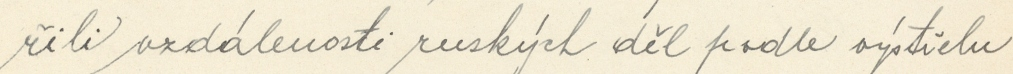řili vzdálenosti ruských děl podle výstřelu
